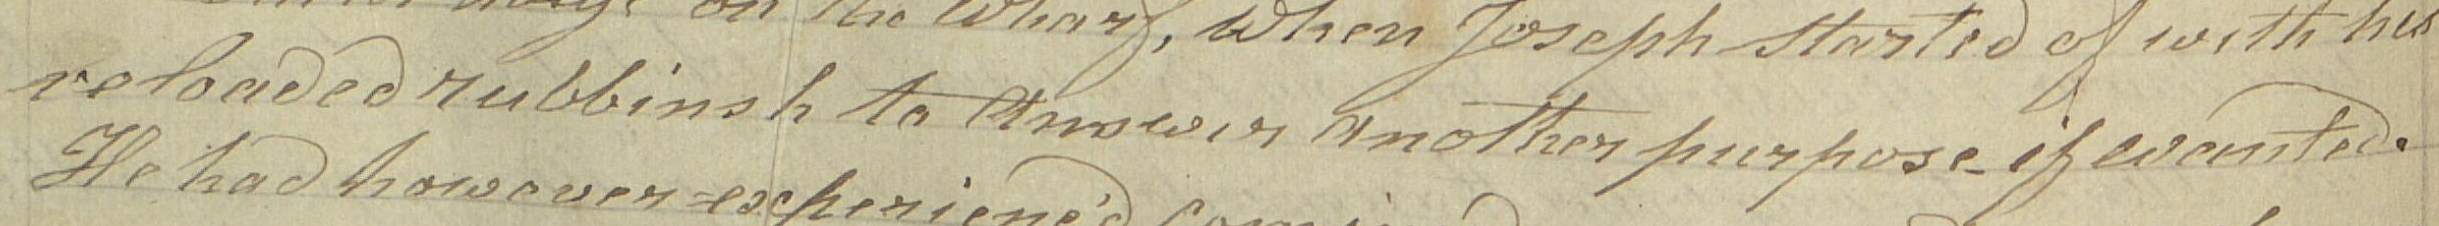reloaded rubbinsh to Answer another purpose if evented.
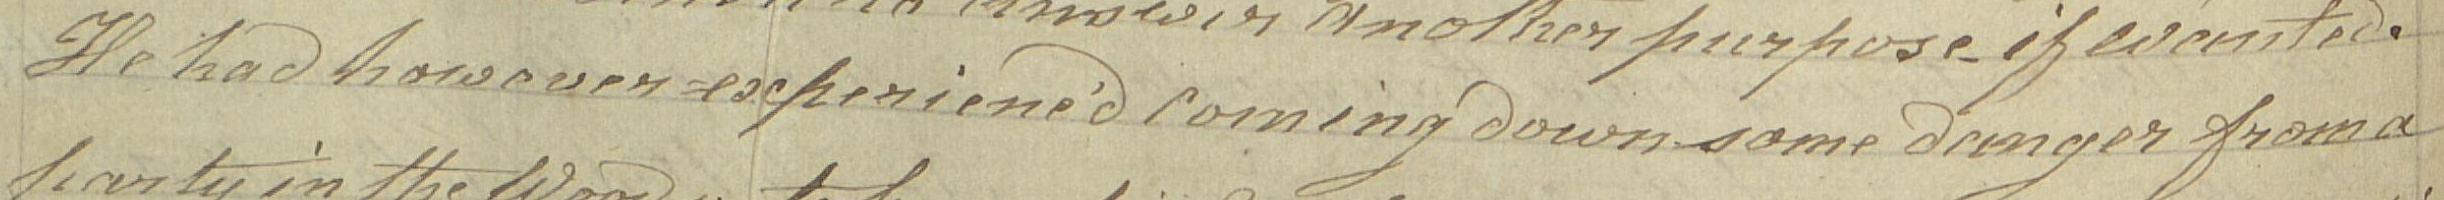He had however experienc'd Coming down some danger from a
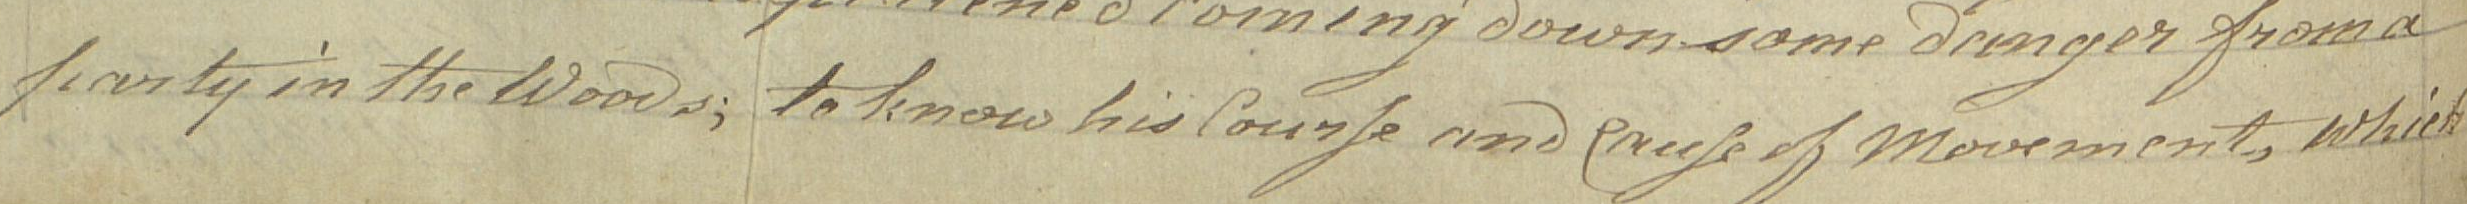fearty in the Woods; to know his Course and Cause of Movement, Which
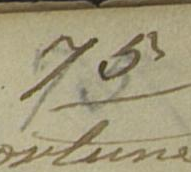75
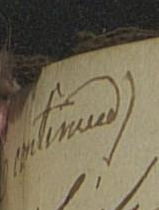C continued)
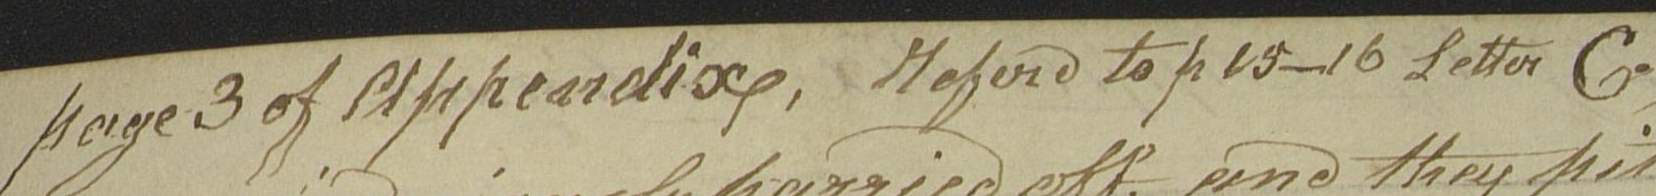page 3 of Appendix, referd to p 15-16 Letter C.
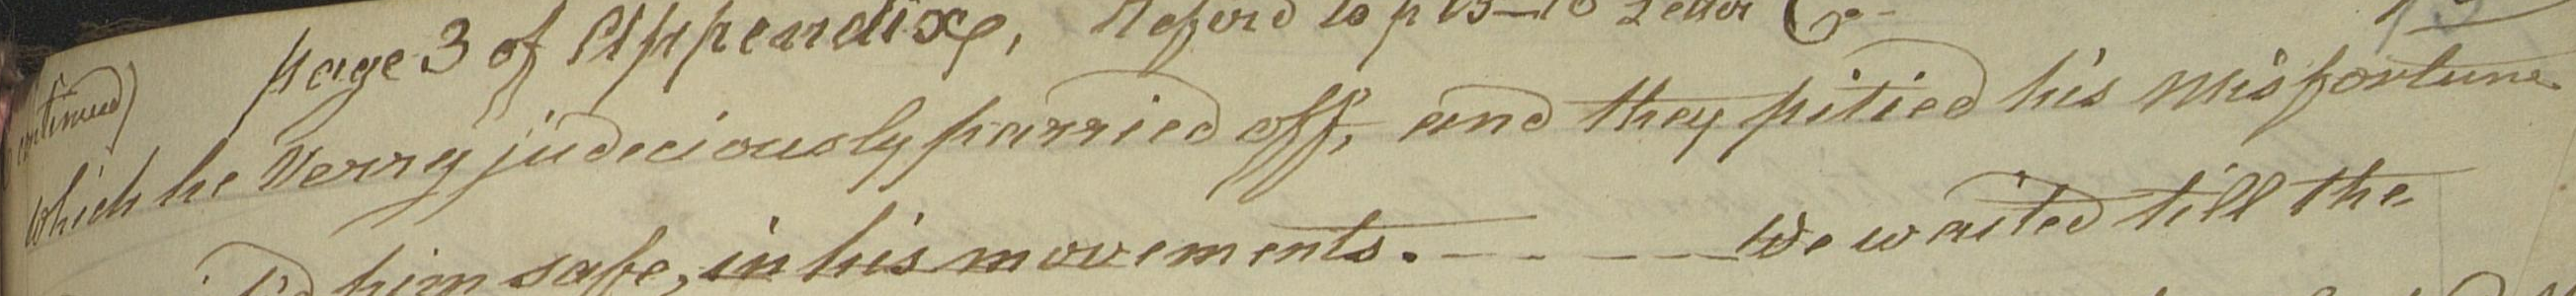which he verry judiciously parried off, and they pitied his misfortune
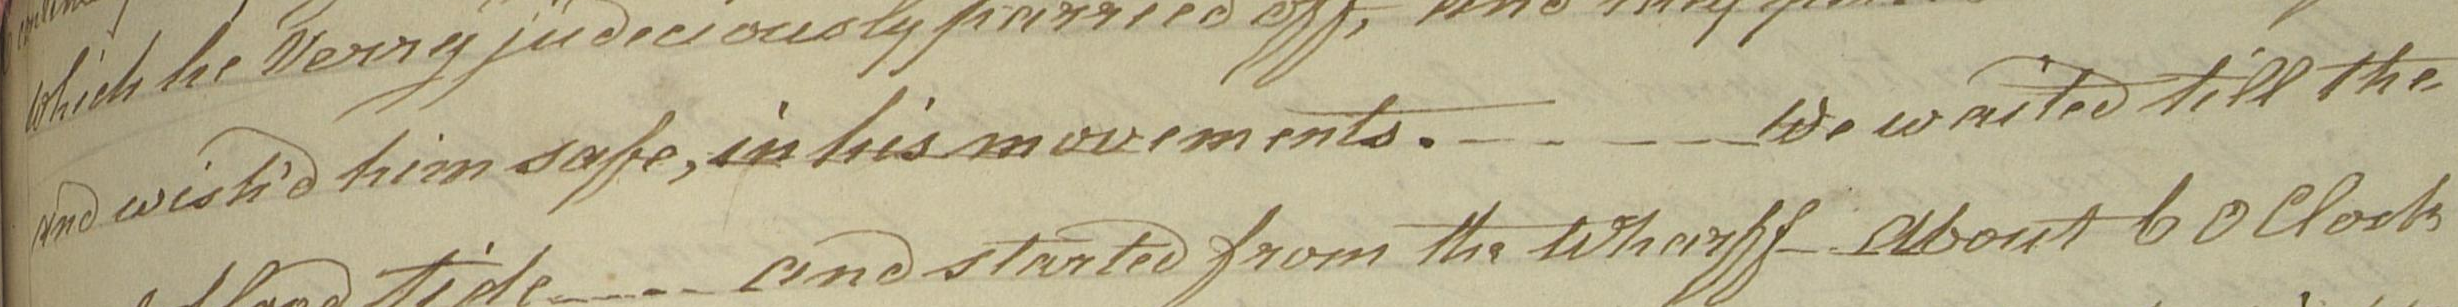and wish'd him safe, in his movements. We waited till the
